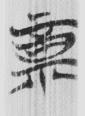福
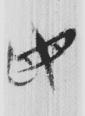母
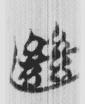㡭
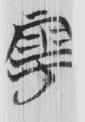𩁹
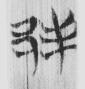邦
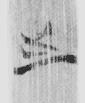之
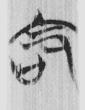命
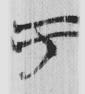于
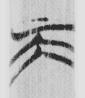天
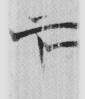下
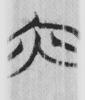亦
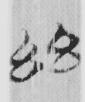𢆶
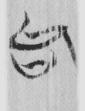句
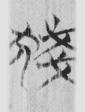{犬戔}
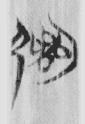{尸㡭}
